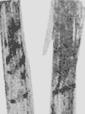𫊟（乎）
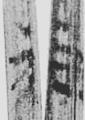夫
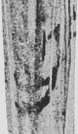此
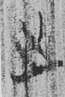之
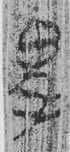{胃刀}（謂）
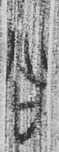○（小）
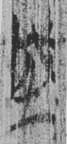城（成）
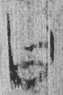曰
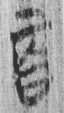百
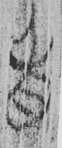眚（姓）
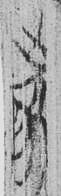之所
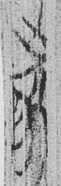所
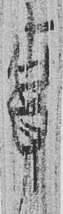貴
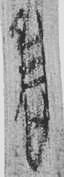唯
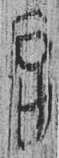君
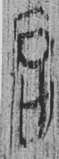君
